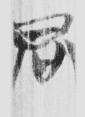君
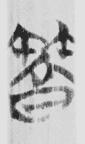{竹亯}
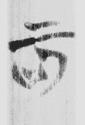可
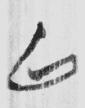㠯（以）
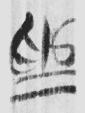爲
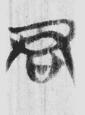君
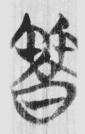{竹亯}
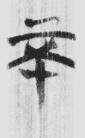不
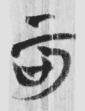可
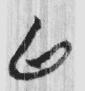㠯（以）
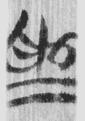爲
